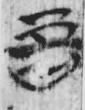○（期）
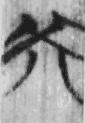癸
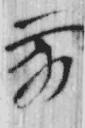亥
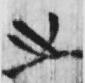之
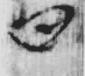日
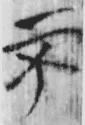不
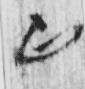㠯
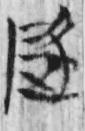阩
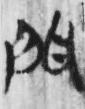門
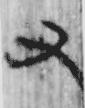又
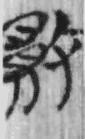敗
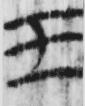王
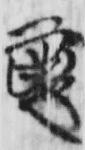婁
